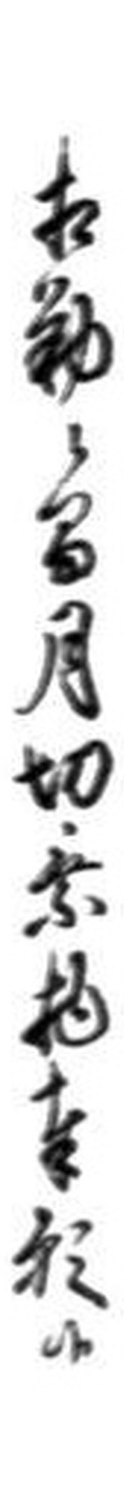相勤候間月切乗物奉願候
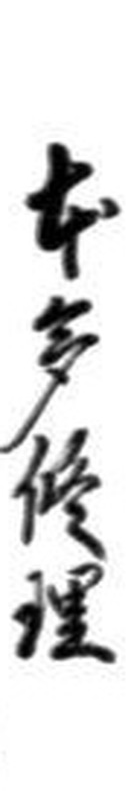本多修理
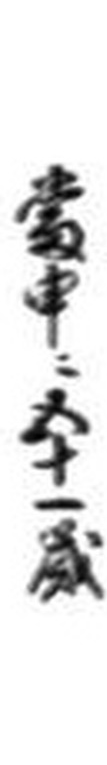当申ニ五十一歳
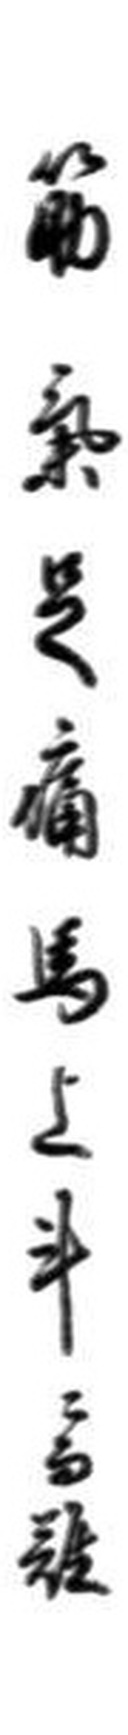筋気足痛馬上計ニ而難
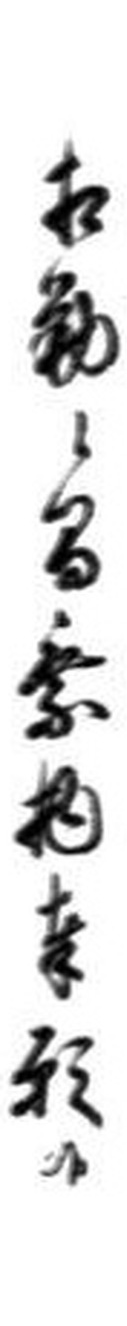相勤候間乗物奉願候
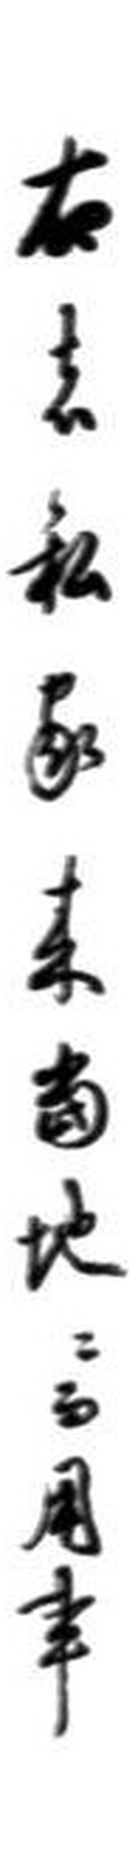右者私家来当地ニ而用事

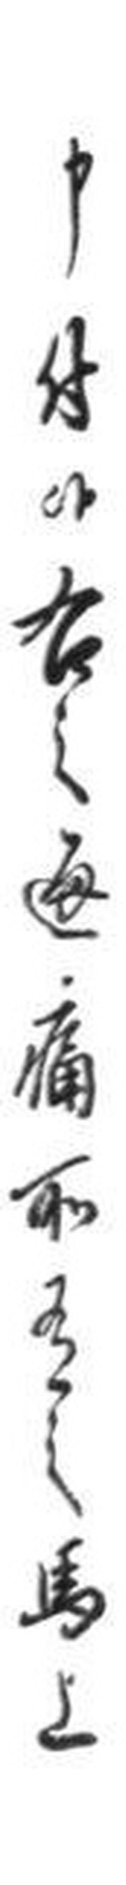申付候右之通痛所有之馬上
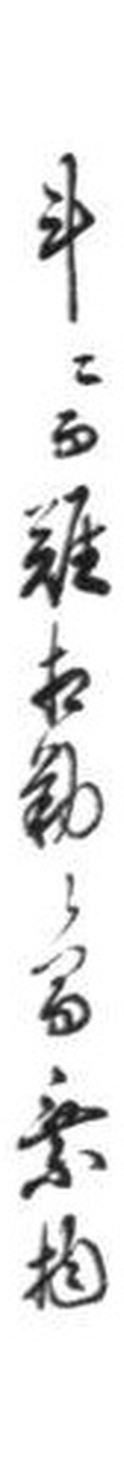計ニ而難相勤候間乗物
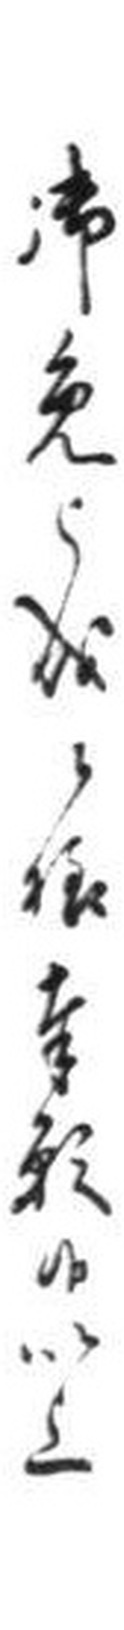御免被成候様奉願候以上
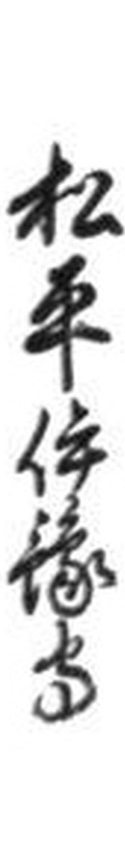松平伊予守
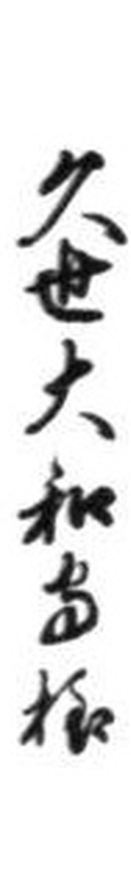久世大和守様
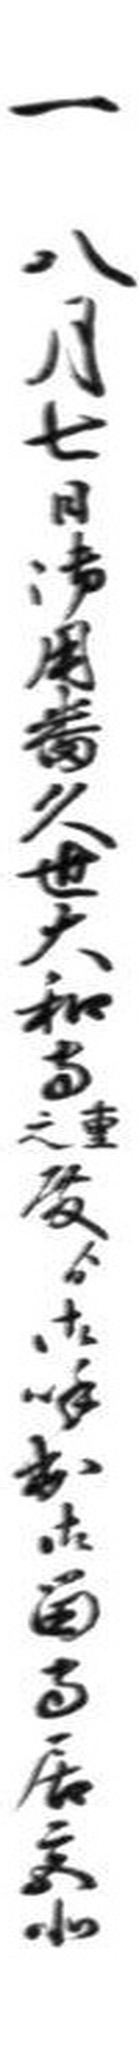一八月七日御用番久世大和守重之殿ゟ御呼出御留守居宮北
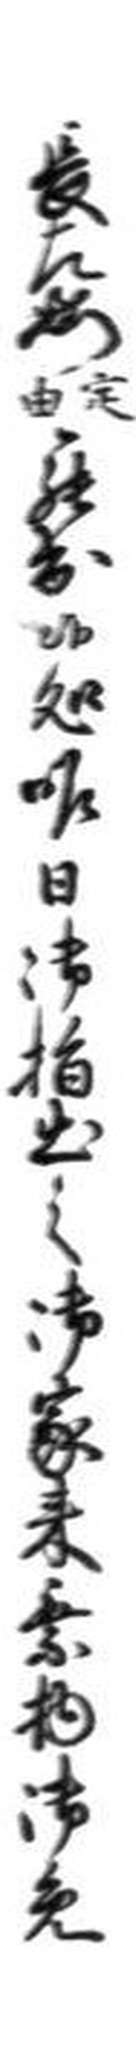長左衛門定由罷出候処昨日指出之御家来乗物御免
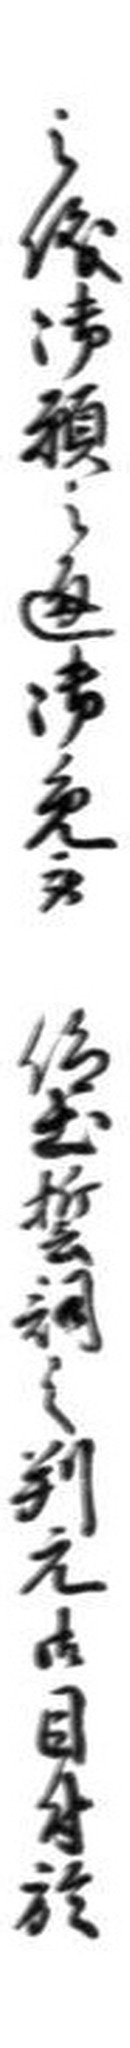之儀御願之通御免被仰出誓詞之判元御目付於
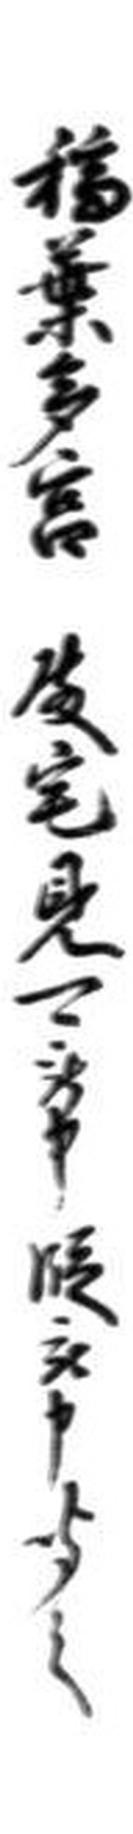稲葉多宮殿宅見可被申段被申聞之
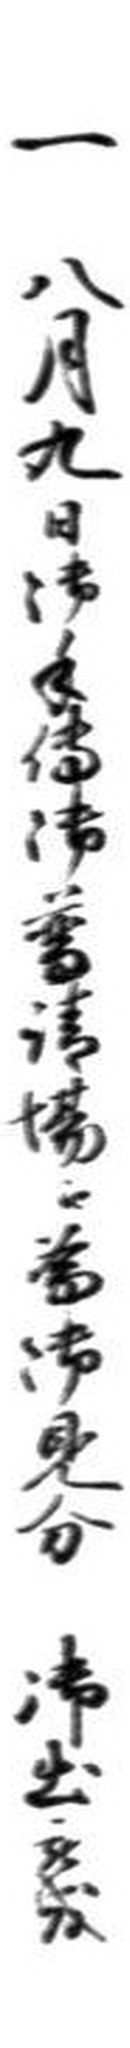一八月九日御手伝御普請場江為御見分御出被成
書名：家譜 三十一 吉邦公 享保元年
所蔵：福井県文書館 Fukui Prefectural Archives
